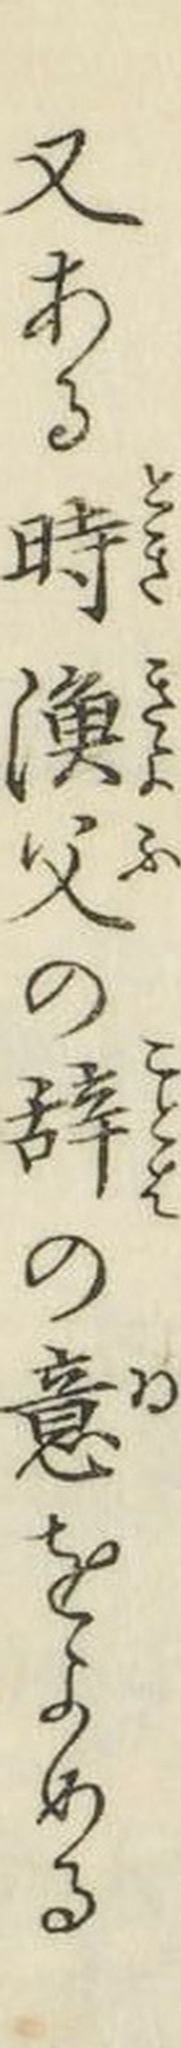又ある時漁夫の辞の意をよめる
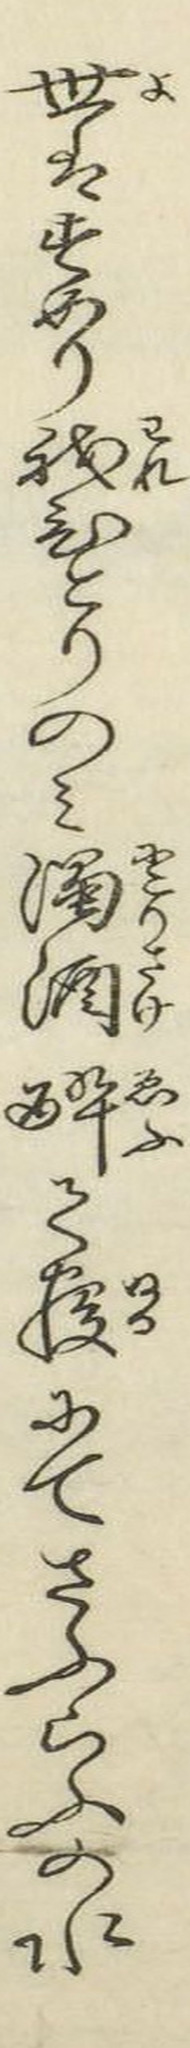世はすめり我ひとりのみ濁酒酔て寝にてさふらふの水
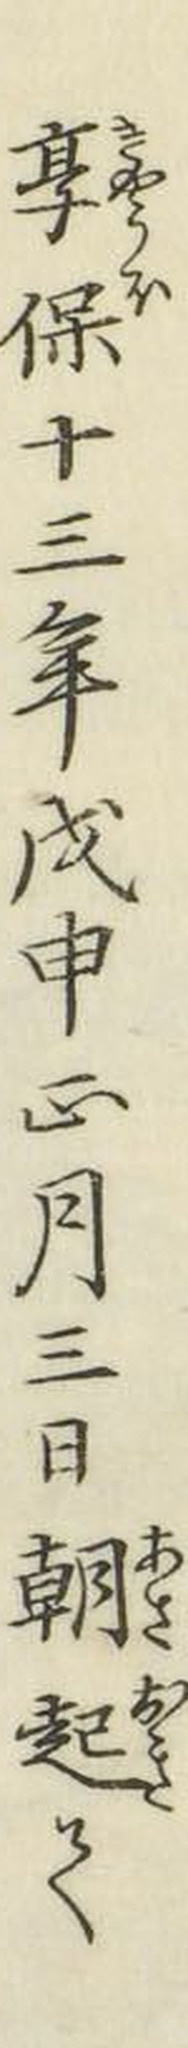享保十三年戊申正月三日朝起て
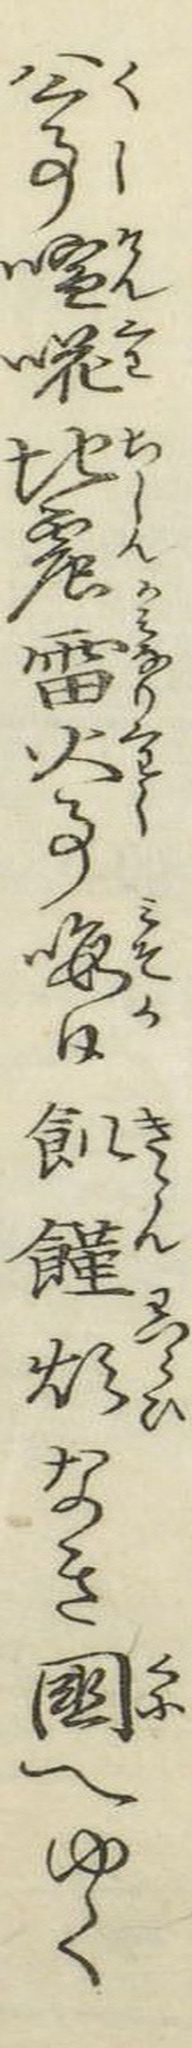公事喧嘩地震雷火事晦日飢饉煩なき国へゆく
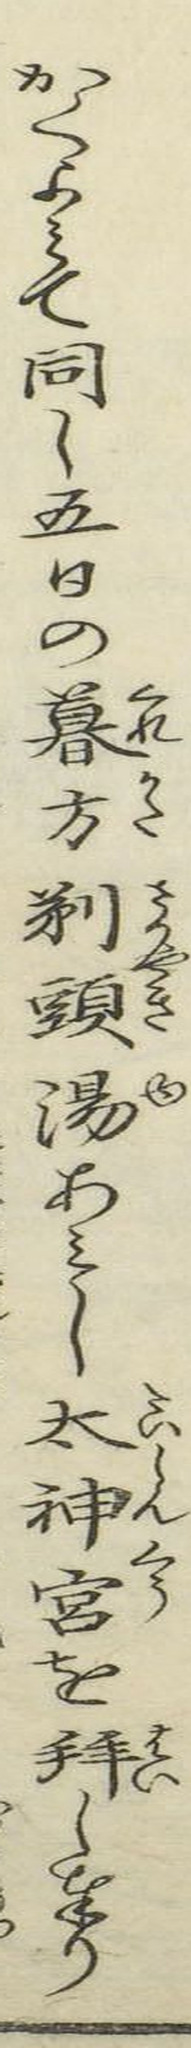かくよみて同し五日の暮方剃頭湯あみし太神宮を拝し奉り
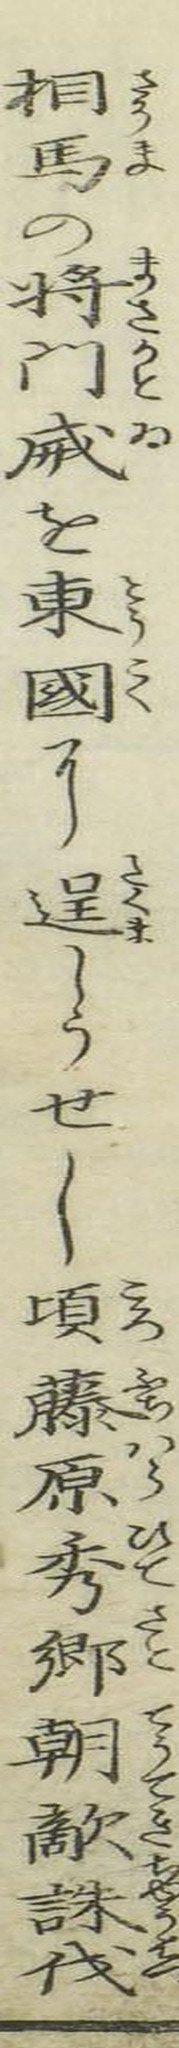相馬の将門威を東国に逞しうせし頃藤原秀郷朝敵誅伐
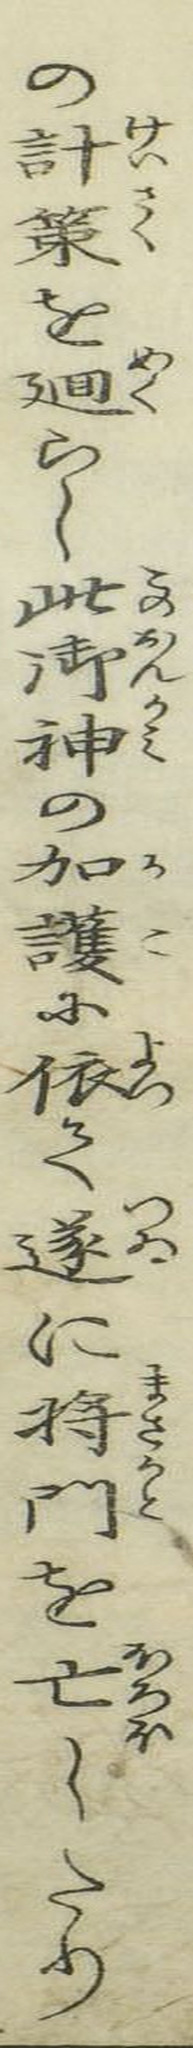の計策を廻らし此御神の加護に依て遂に将門を亡したり

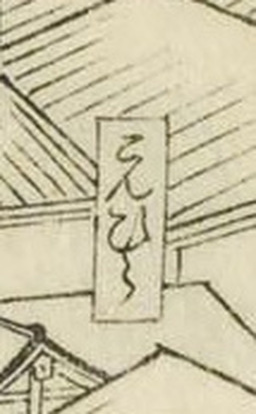こんひら

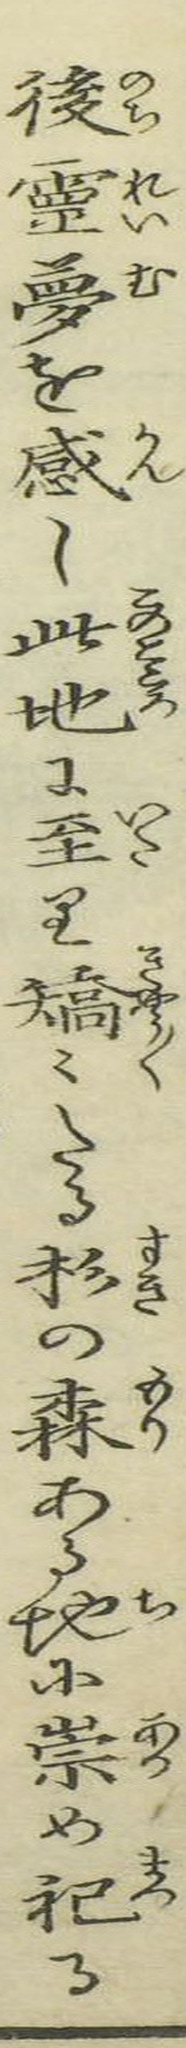後霊夢を感し此地に至り矯々たる杉の森ある地に崇め祀る
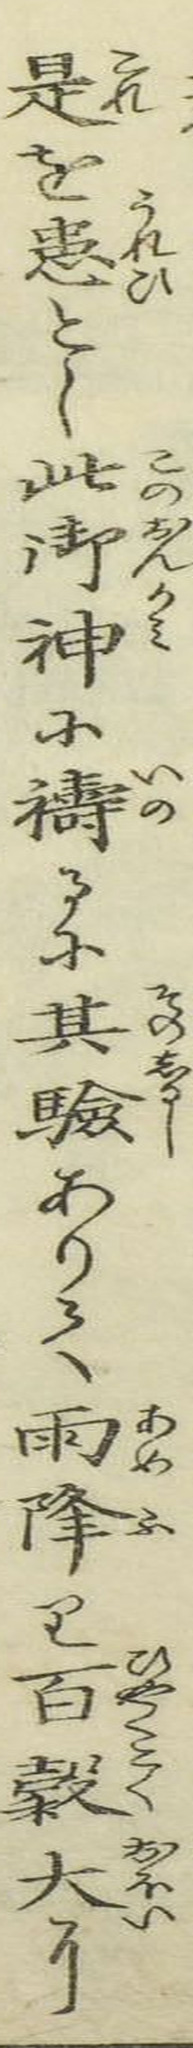是を患とし此御神に禱るに其験ありて雨降り百穀大に
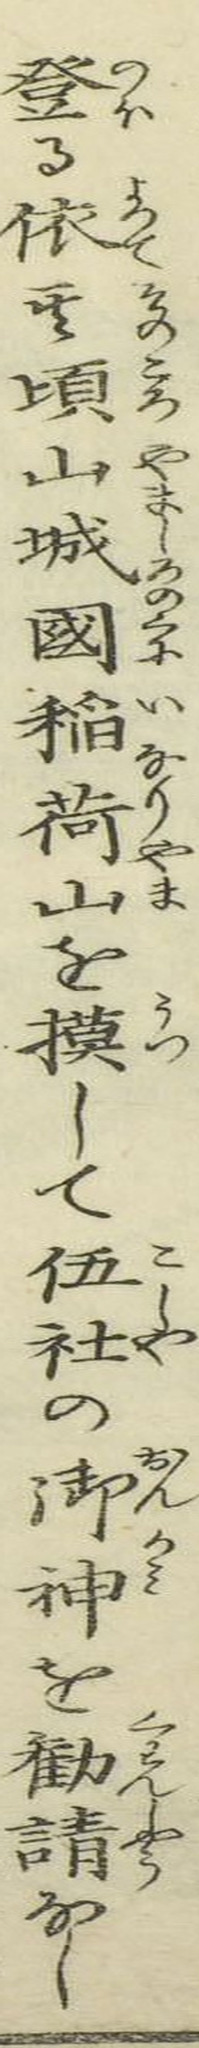登る依其頃山城國稲荷山を摸して伍社の御神を勧請なし
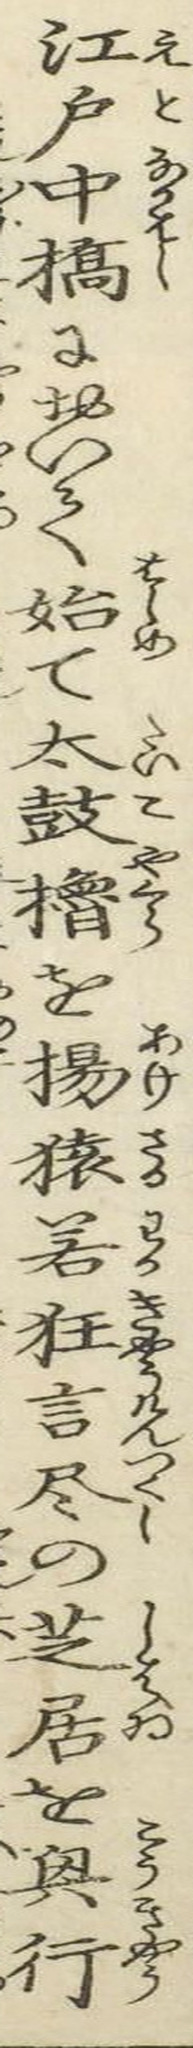江戸中橋において始て太鼓櫓を揚猿若狂言尽の芝居を興行
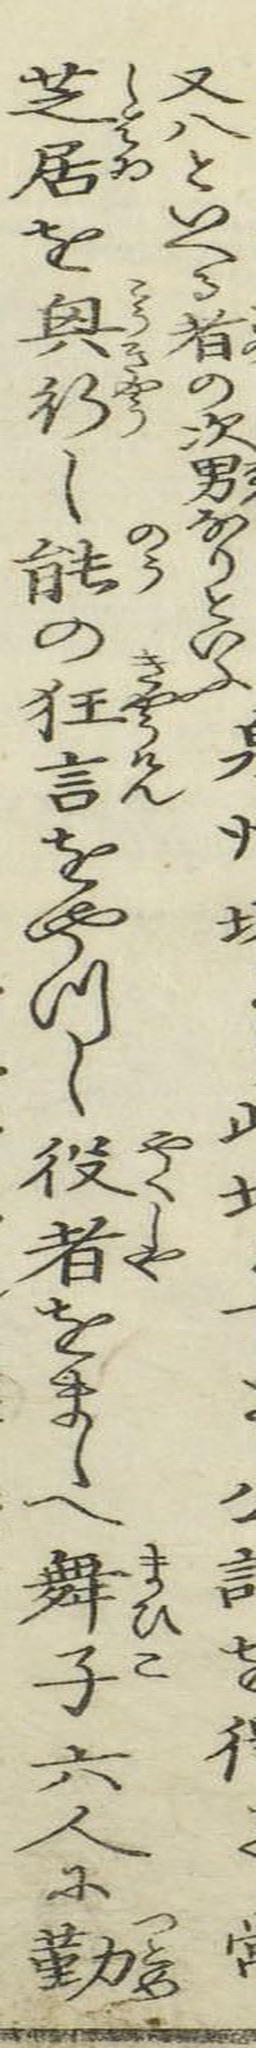芝居を興行し能の狂言をやつし役者をましへ舞子六人に勤
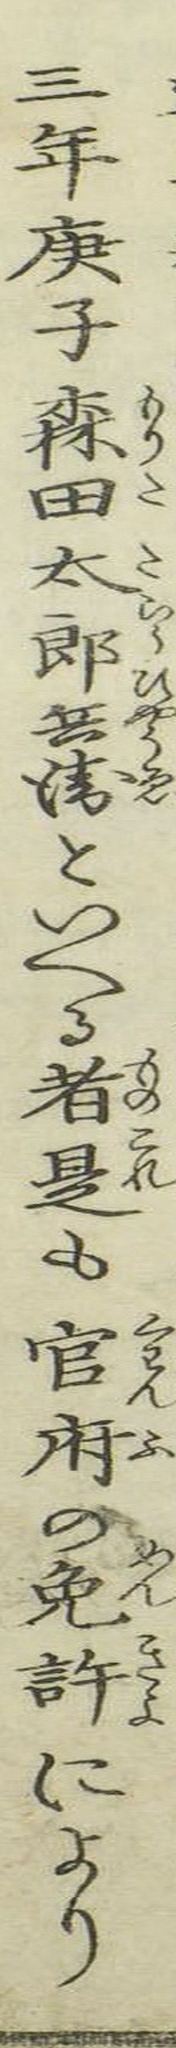三年庚子森田太郎兵衛といへる者是も官府の免許により

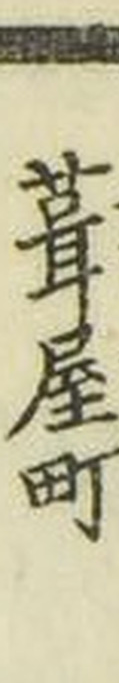葺屋町
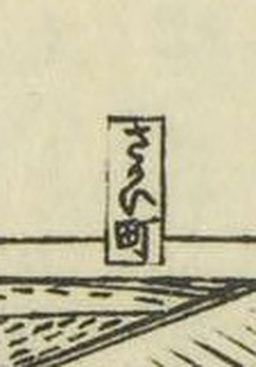さかい町
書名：江戸名所図会 20巻 巻之2
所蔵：東京学芸大学教育コンテンツアーカイブ
